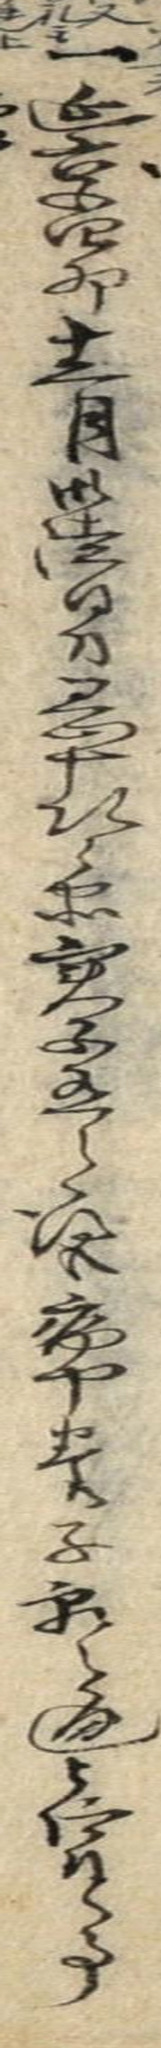一延享四卯十二月御徒目付岡十次兵衛実子有之候得共病中養子願之通被仰付候事
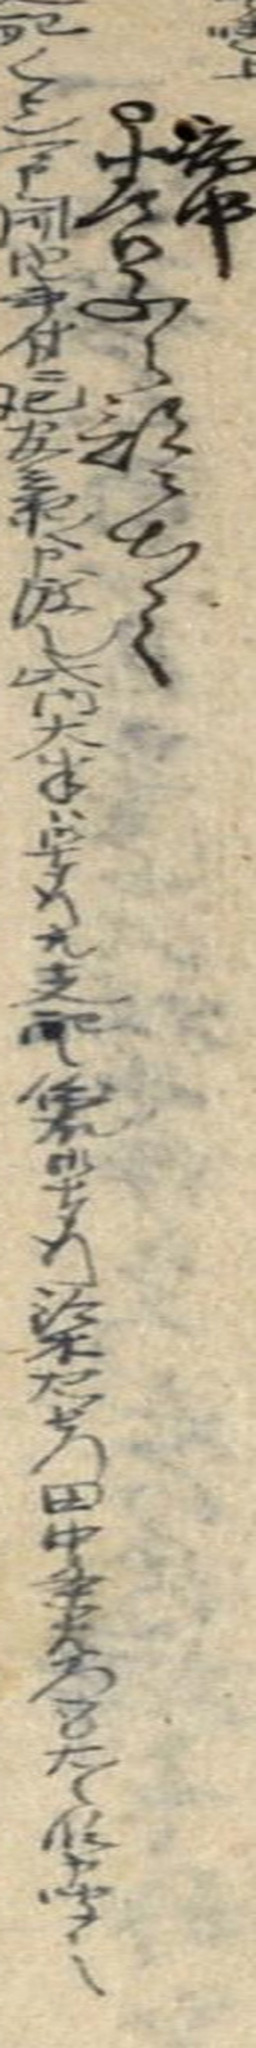者共之支配々々迄可申伺由書付官兵衛へ申渡し此内大半ハ御奉行共支配之儀故御奉行鈴木忠右衛門田中条左衛門右之趣申聞之

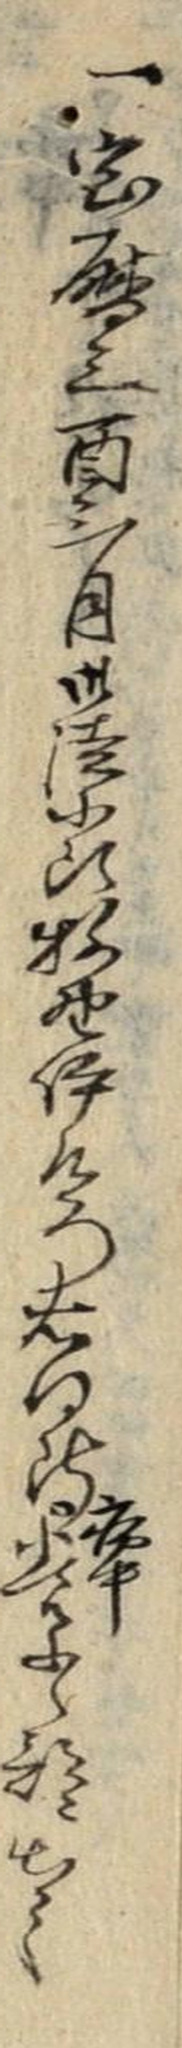一宝暦三酉三月御徒小頭牧野伊左衛門右同断◦病中養子之部に出之
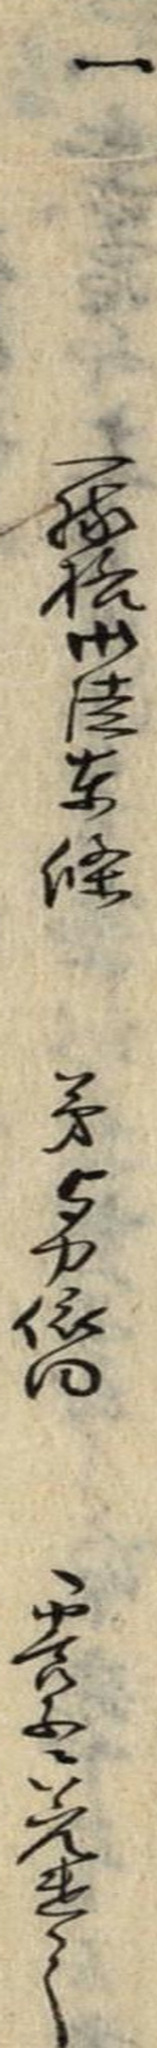一一統格御徒東条弟与力依田へ養子に差遣之
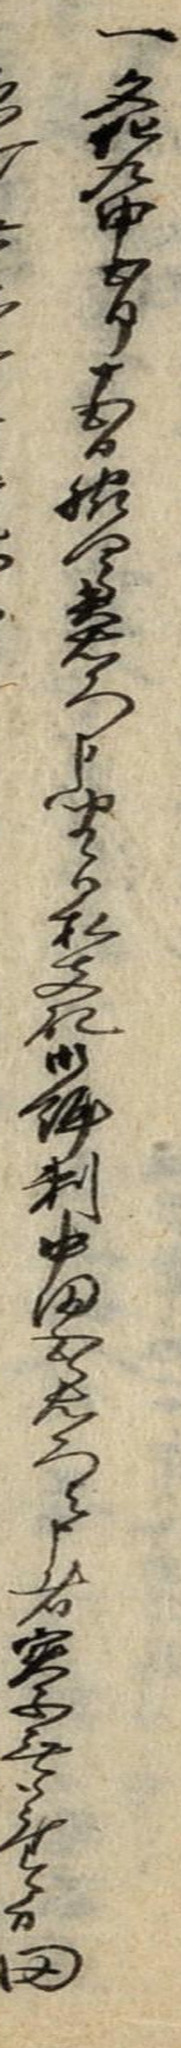一文化九申五月十五日脇田奥右衛門申聞候は私支配御餌刺中田五郎右衛門と申者実子無御座候に付田
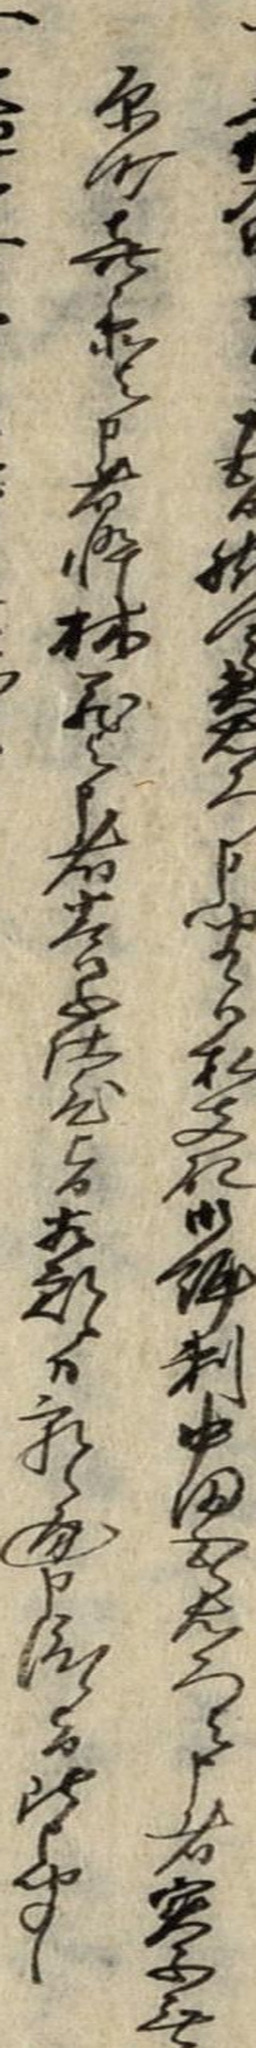原町喜兵衛と申者悴林蔵と申者養子仕度旨相願候に付願之通申渡候旨被申聞之
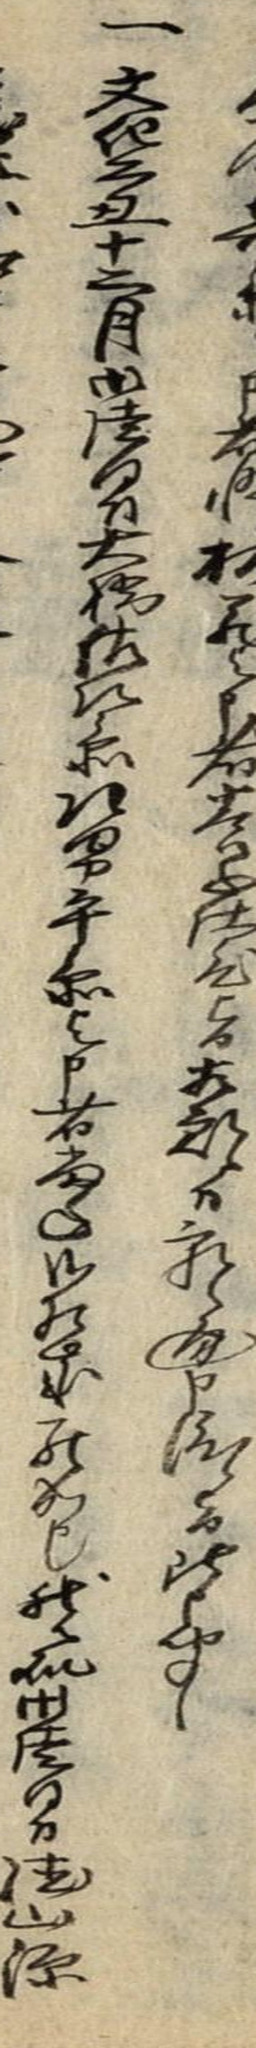一文化二丑十二月御徒目付大橋佐次兵衛次男平兵衛と申者当年弐拾歳罷成申し候然る処御徒目付徳山源
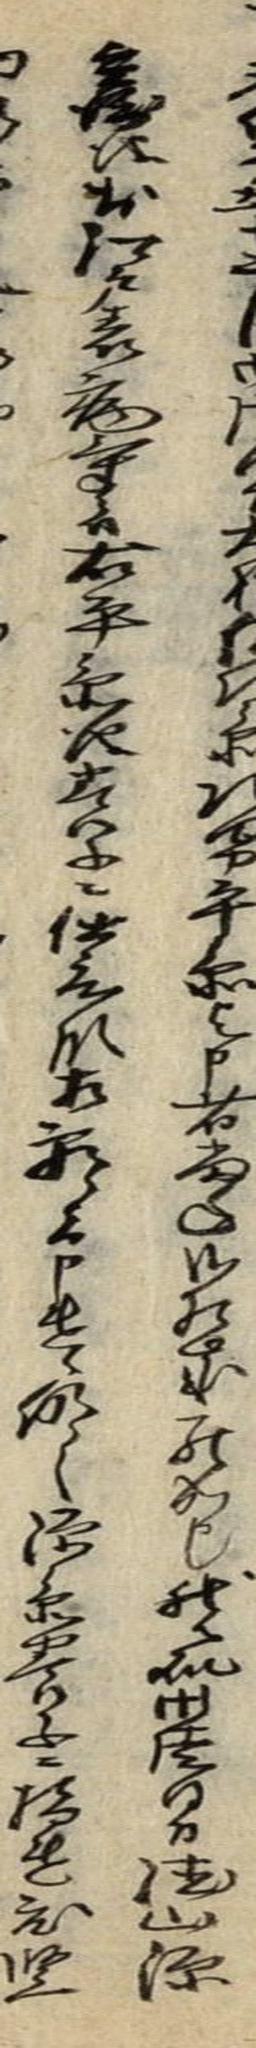兵衛儀於江戸表病気に付右平兵衛儀養子に仕度段相願之旨申遣候仍之源兵衛養子に指遣度竪
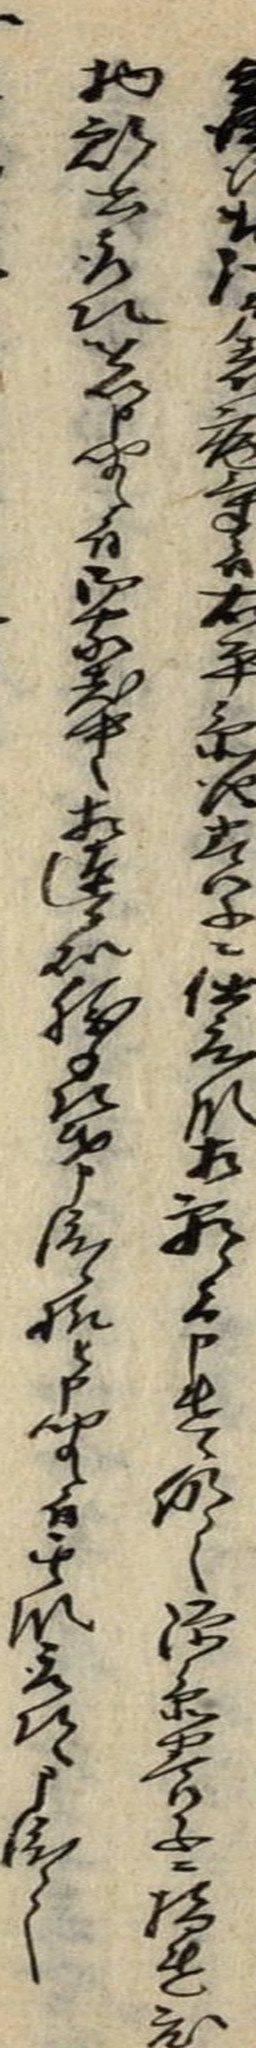物願書取次を以申聞候に付御家老中へ相達候処勝手次第申渡候様被申聞候に付其段取次へ申渡之
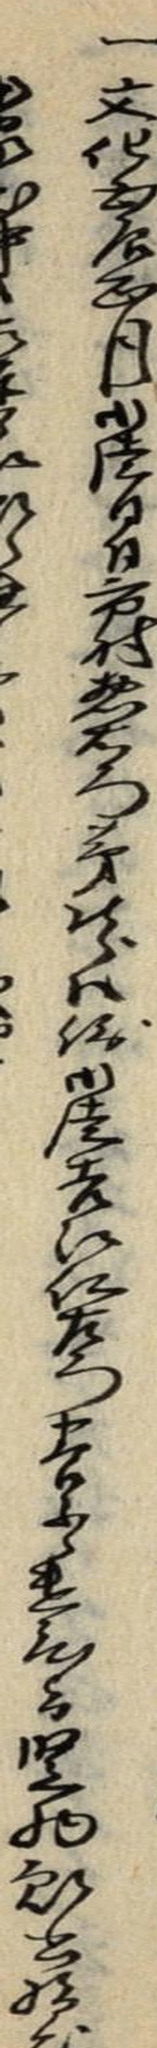一文化五辰正月御徒目付市村惣右衛門弟次郎八儀御徒吉江仁左衛門養子に遣度旨竪物願書指出
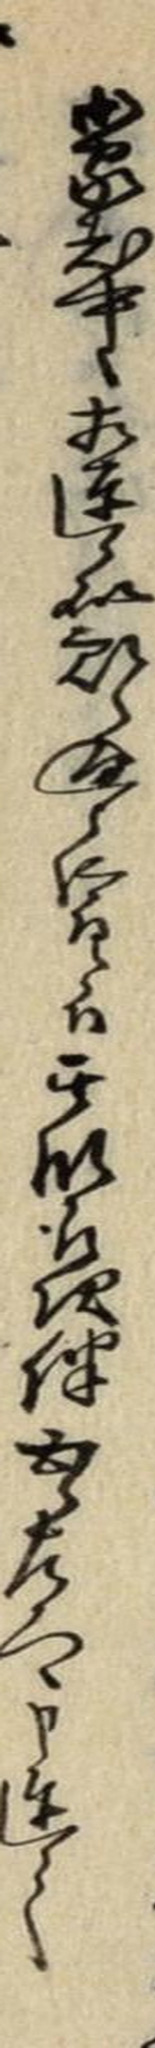御家老中へ相達候処願之通被仰付候に付其段取次伴五郎左衛門へ申達之
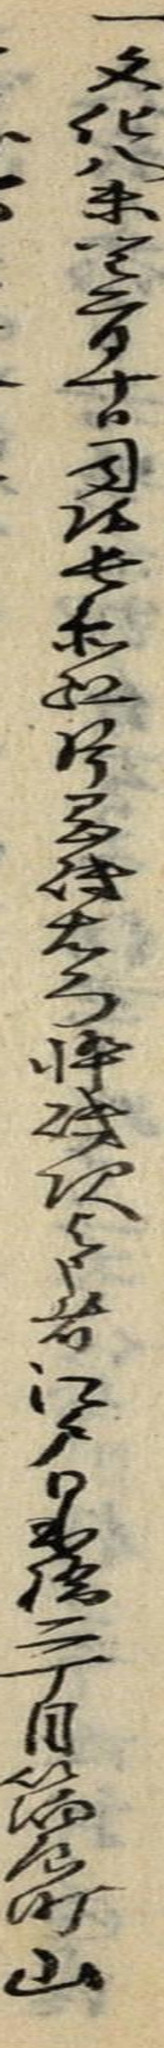一文化八未閏二月十日周防長兵衛組片岡磯右衛門倅磯次と申者江戸日本橋二丁目箔屋町山
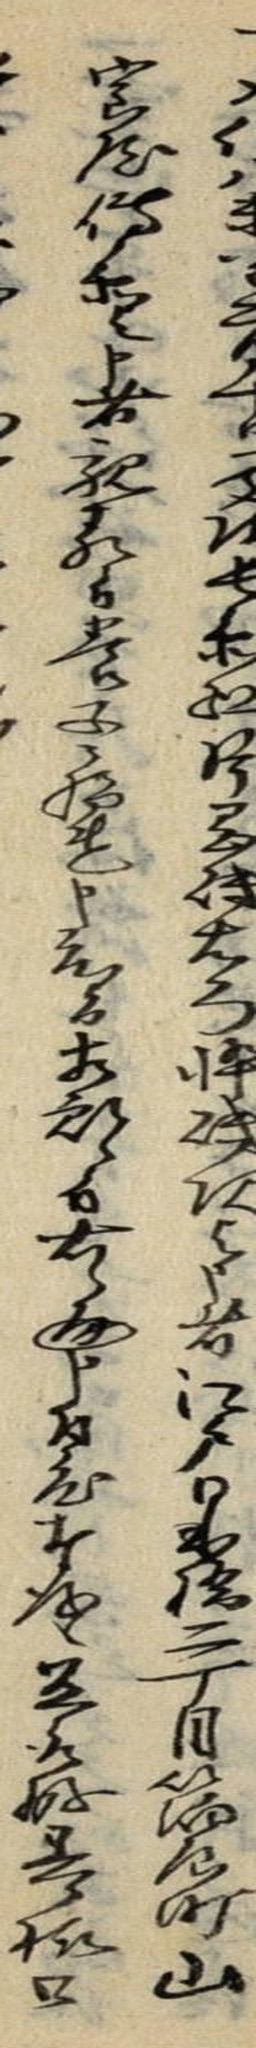室屋伝兵衛と申者親類に付養子に指遣申度旨相願候に付右之通申付度奉存候宜取扱呉候様口
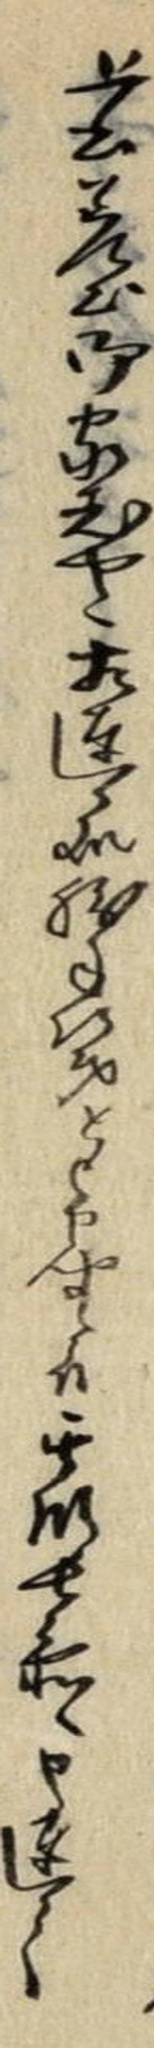上書差出御家老中へ相達候処勝手次第と被申聞候に付其段長兵衛へ申達之
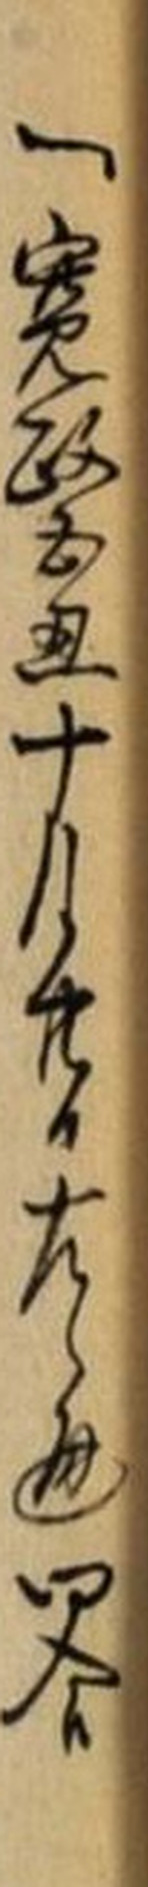一寛政五丑十月廿日右之通問合
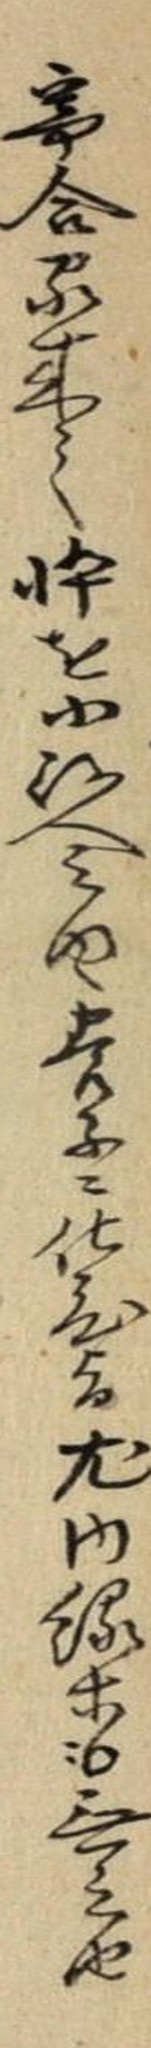寄合家来之悴を小役人之内へ養子に仕度旨尤内縁等も無之由
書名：養子縁組之部
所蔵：福井県文書館 Fukui Prefectural Archives
